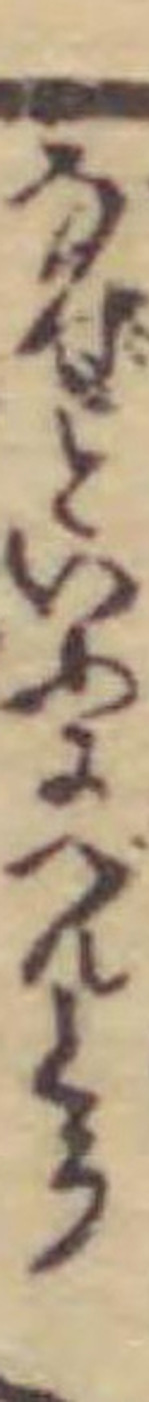なぜといふにべんとう
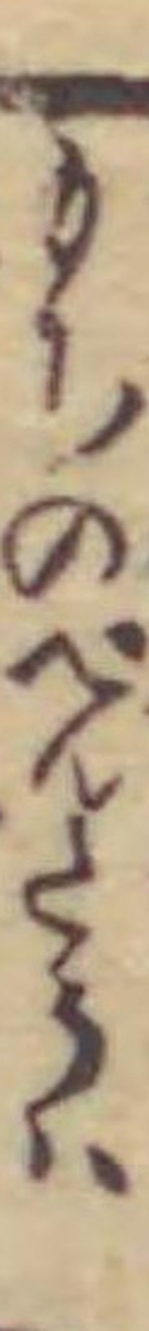もちのべんとうは
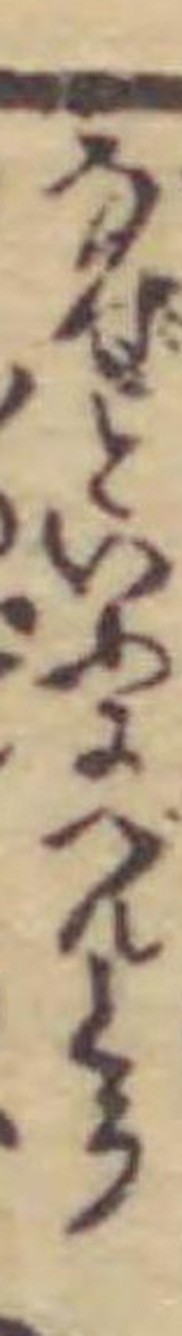なぜといふにべんとう
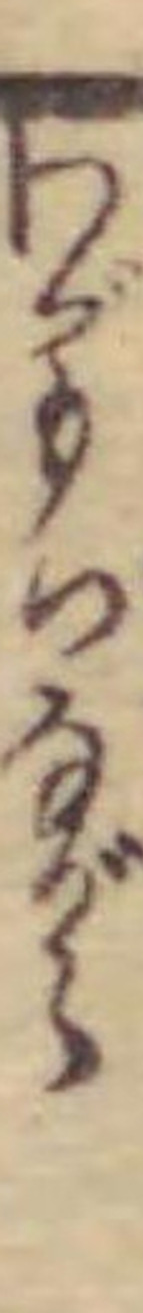わがもつながら
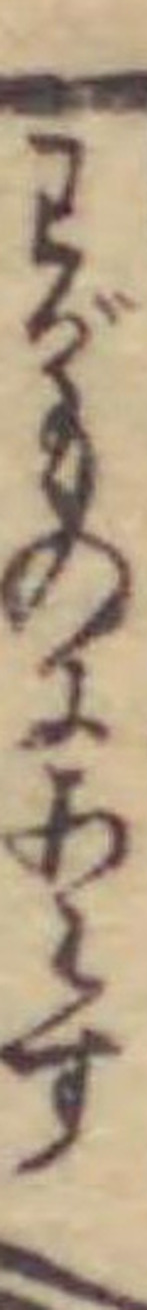わがものにあらす
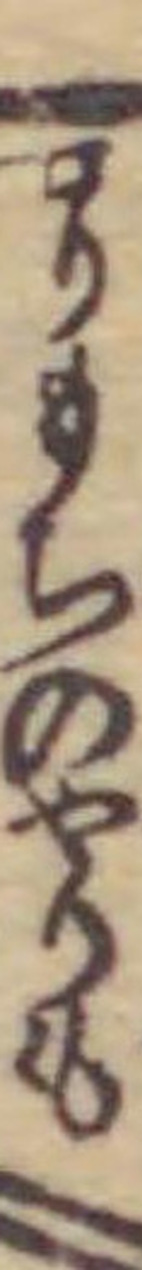やりもちのやりも
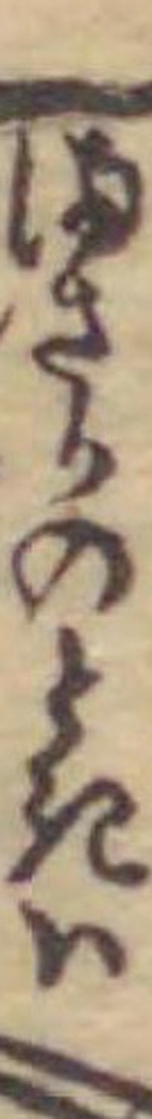まさかのときは
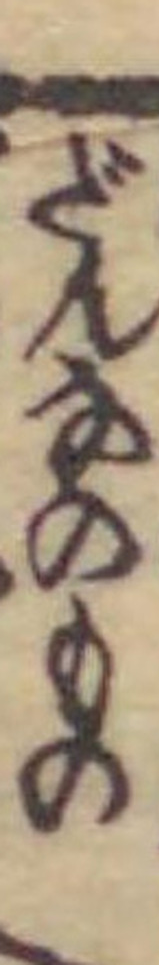だんなのもの
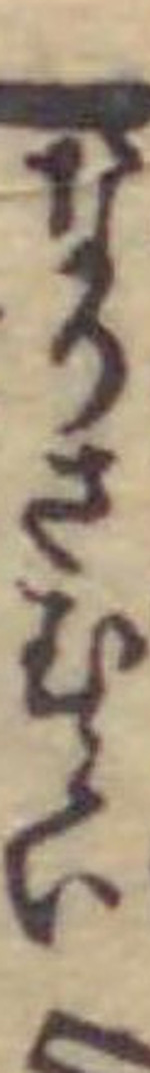なりさむらい
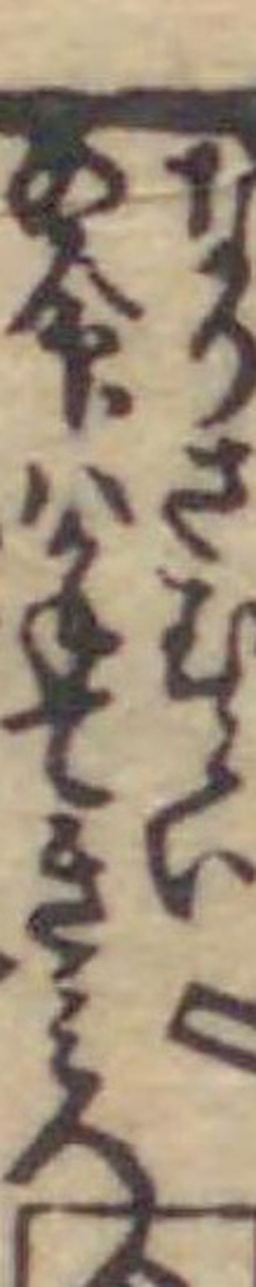の命はかねてきみへ
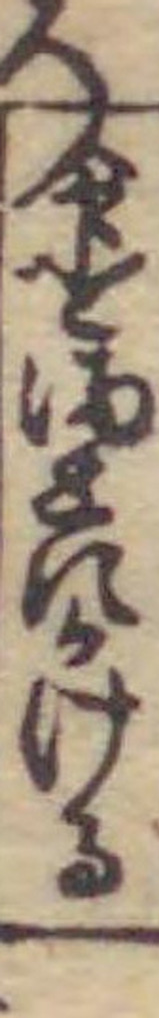命をまとにかけ
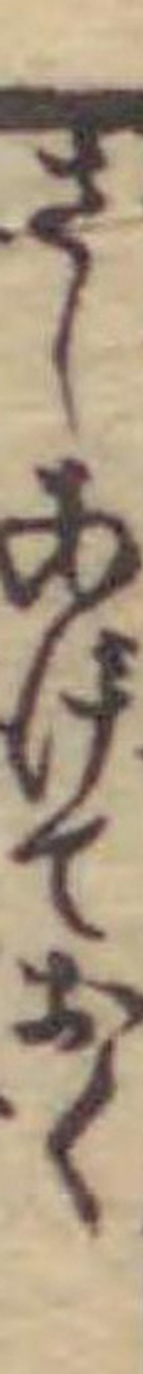さしあげておく
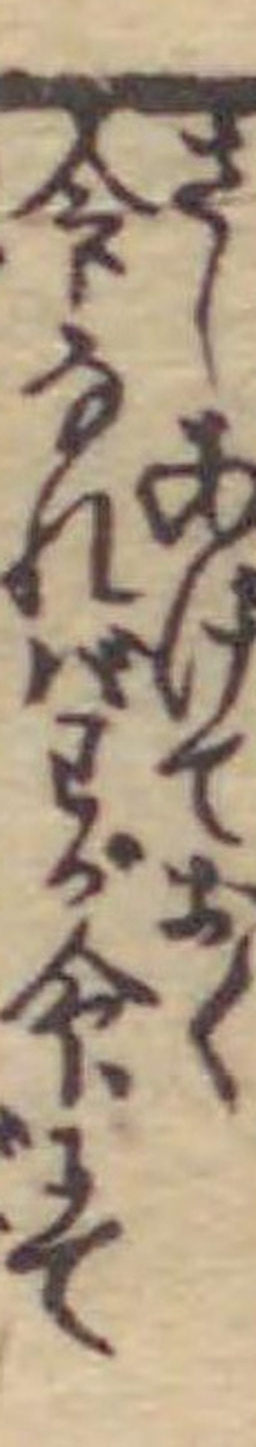命なればわが命にて
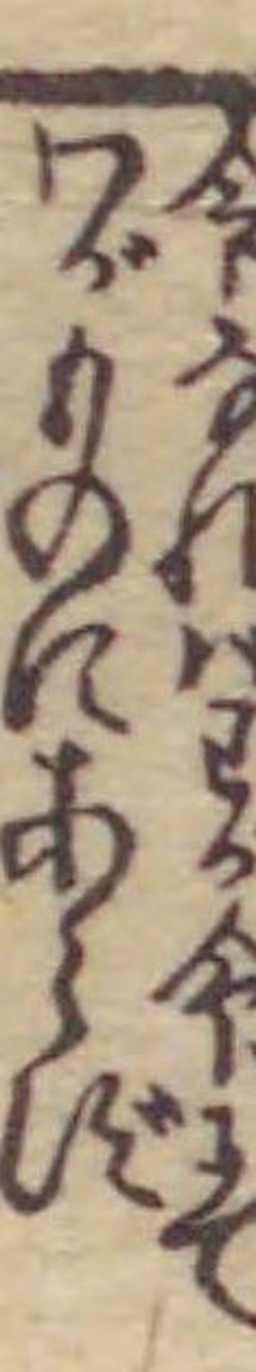わがものにあらず
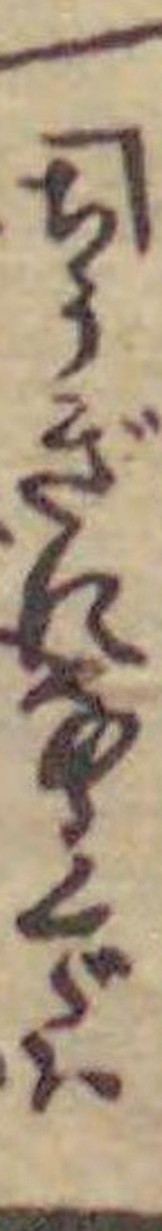〽ちうぎにならでは
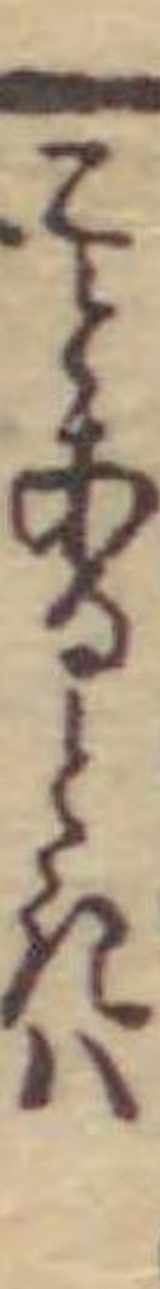ことあるときは
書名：御誂染長寿小紋 : 3巻
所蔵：国立国会図書館 National Diet Library, JAPAN
